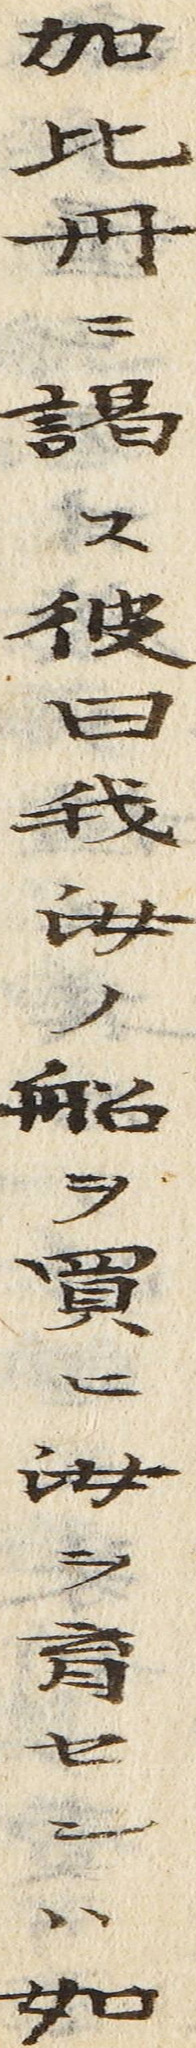加比丹ニ謁ス彼曰我汝ノ船ヲ買ヒ汝ヲ育センハ如
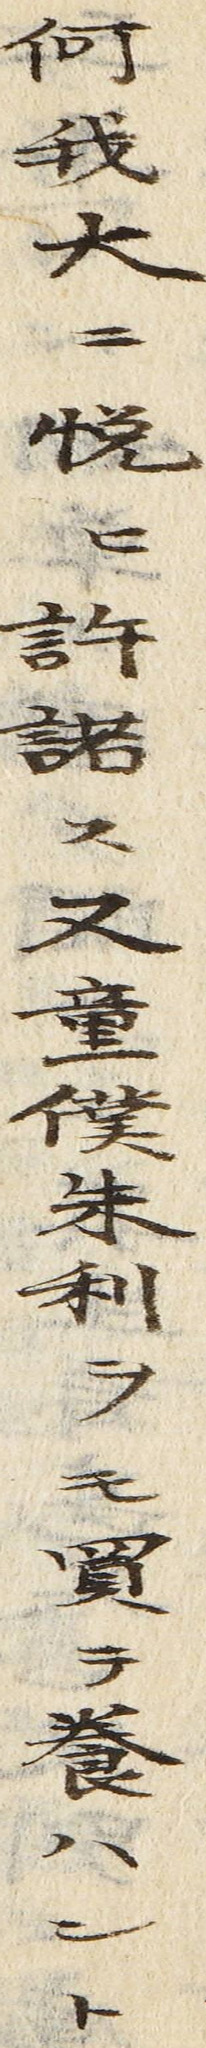何我大ニ悦ヒ許諾ス又童僕朱利ヲモ買テ養ハント
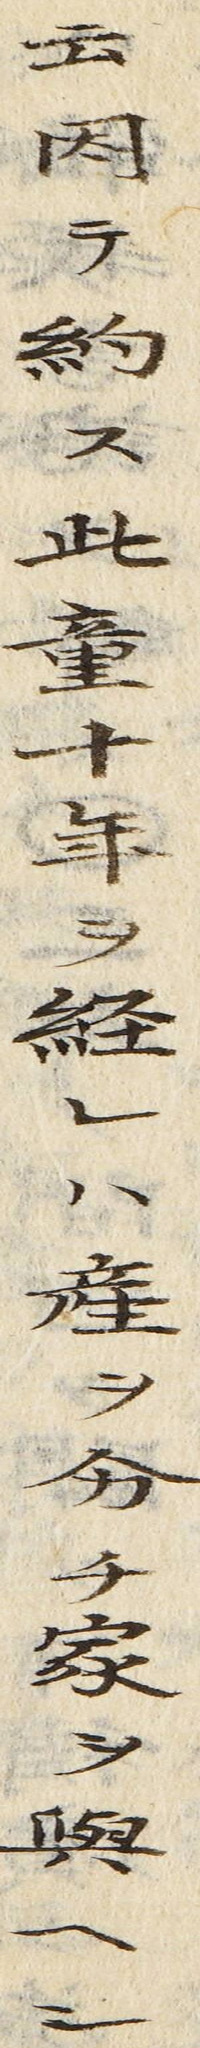云因テ約ス此童十年ヲ経レハ産ヲ分チ家ヲ与ヘシ
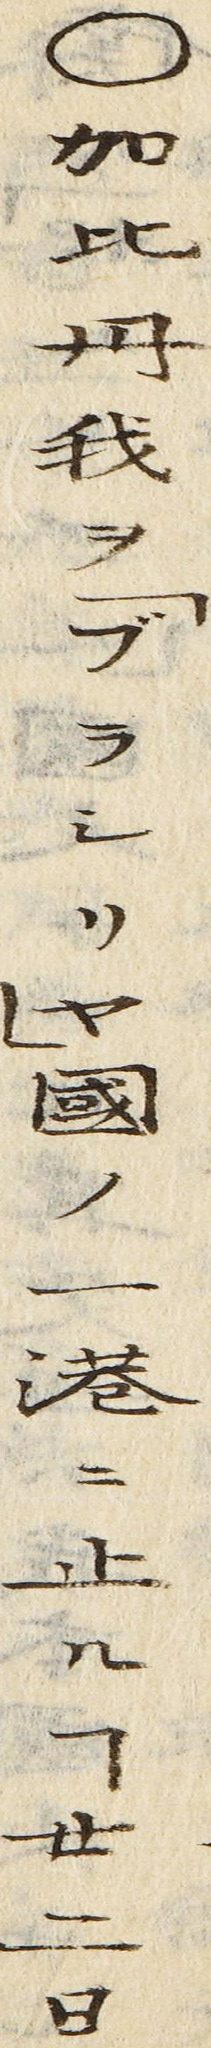◯加比丹我ヲ「ブラシリヤ」国ノ一港ニ止ルコト廿二日
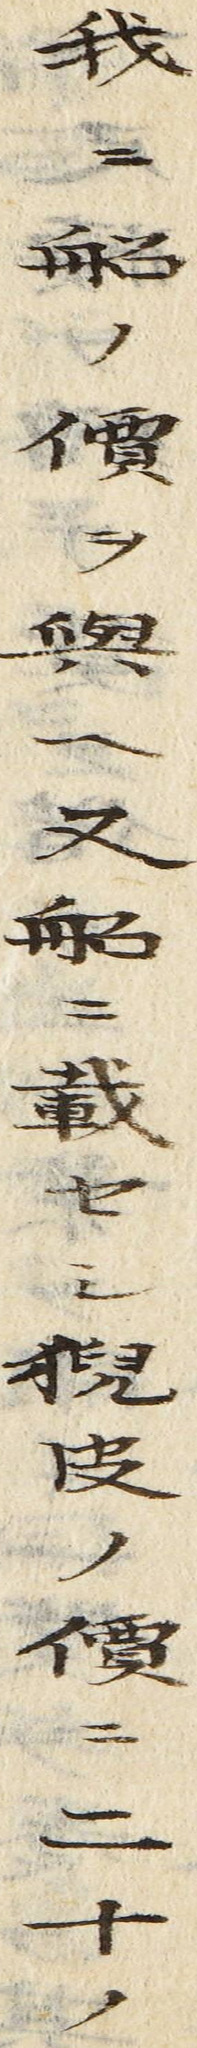我ニ船ノ価ヲ与ヘ又船ニ載セシ猊皮ノ価ニ二十ノ
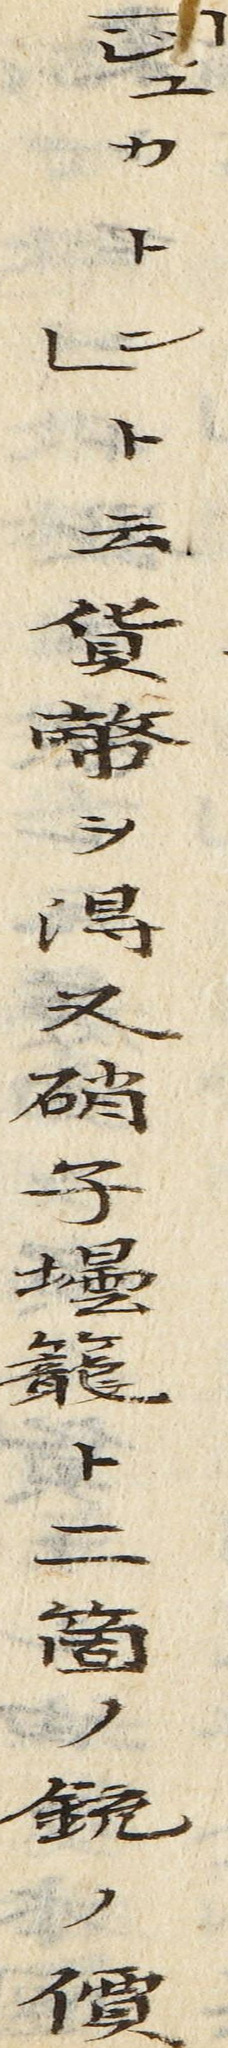「ジユカトン」ト云貨幣ヲ得又硝子壜籠ト二箇ノ銃ノ価
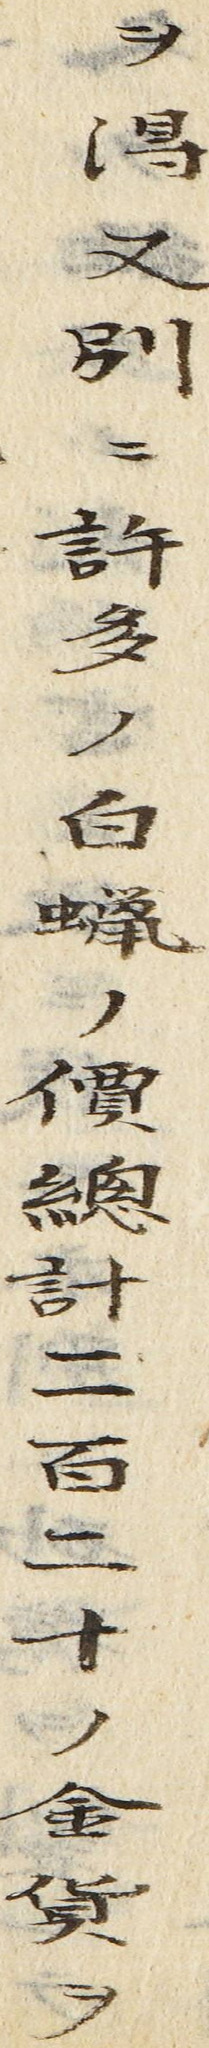ヲ得又別ニ許多ノ白蠟の価総計二百二十ノ金貨ヲ
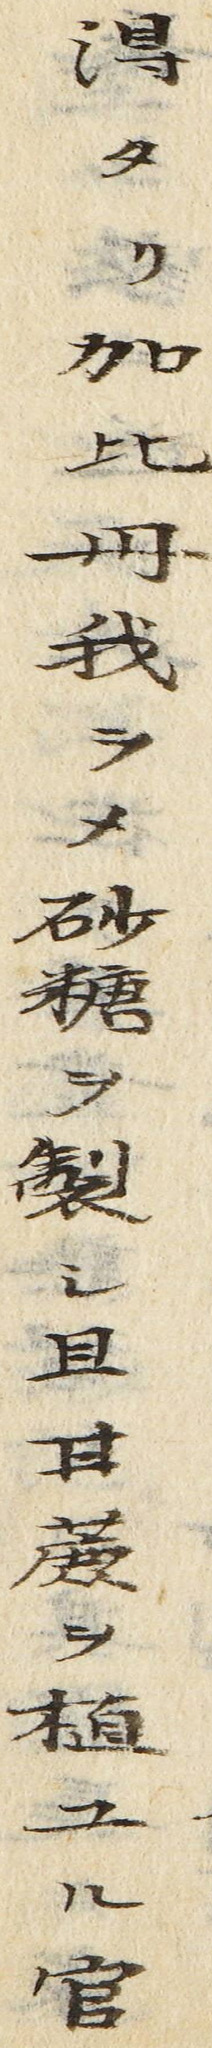得タリ加比丹我ヲシテ砂糖ヲ製シ且甘蔗ヲ植ユル官

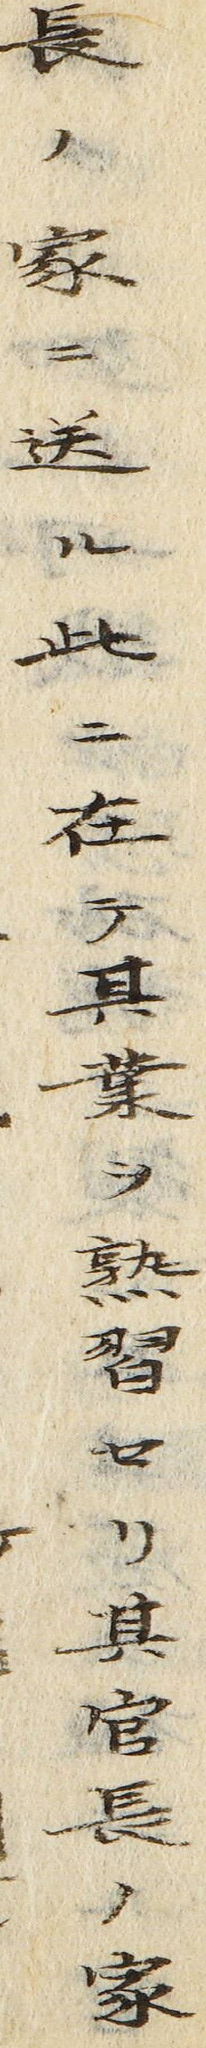長ノ家ニ送ル此ニ在テ其業ヲ熟習セリ其官長ノ家
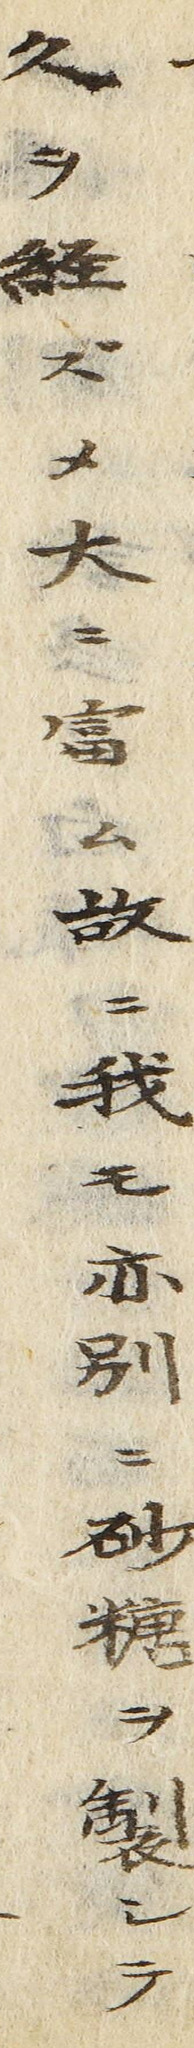久ヲ経ズシテ大ニ富ム故ニ我モ亦別ニ砂糖ヲ製シテ
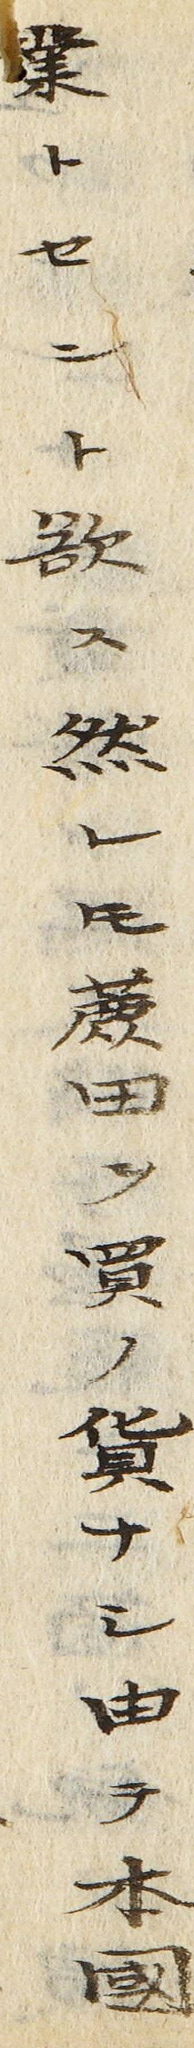業トセント欲ス然レトモ蔗田ヲ買ノ貨ナシ由テ本国
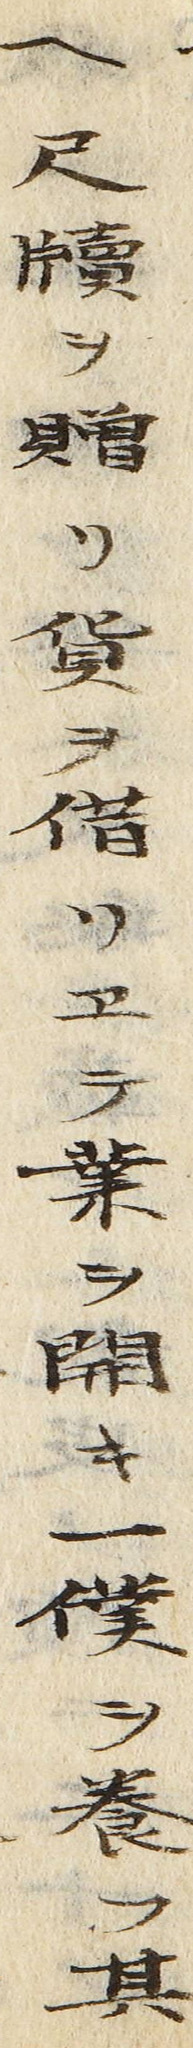ヘ尺牘ヲ贈リ貨ヲ借リヱテ業ヲ開キ一僕ヲ養フ其
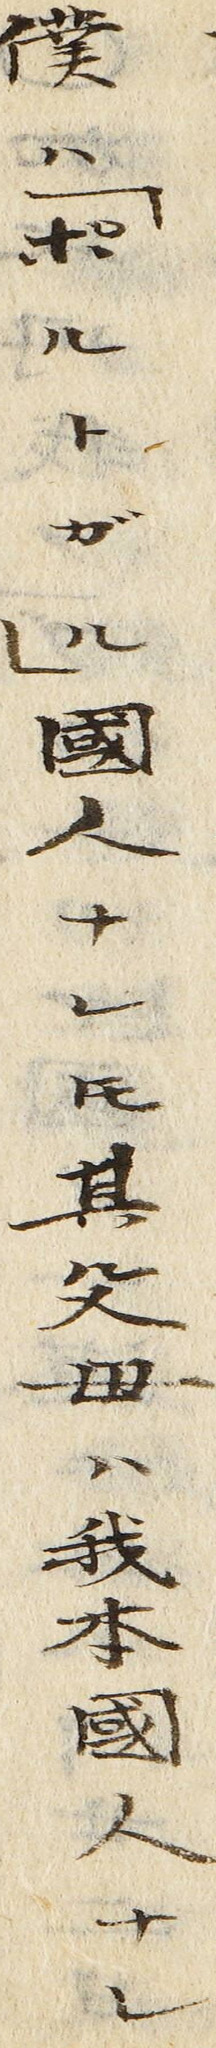僕ハ「ポルトガル」国人ナレトモ其父母ハ我本国人ナレ
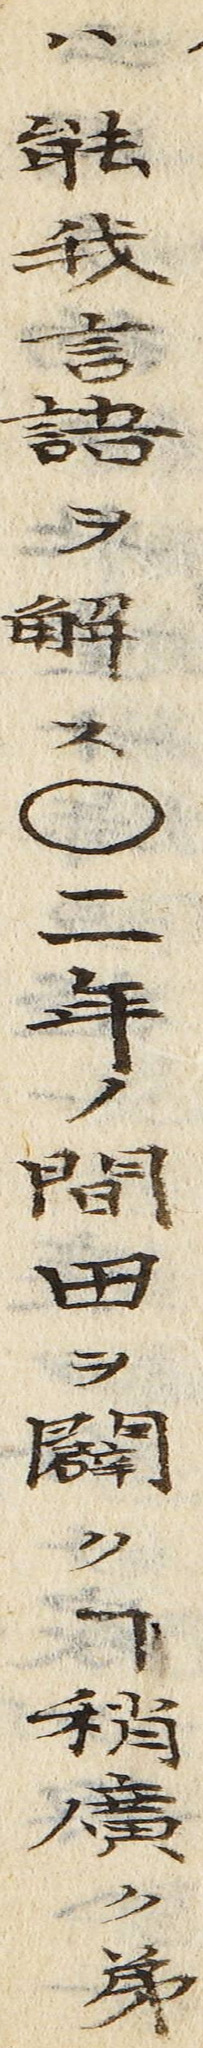ハ能我言語ヲ解ス◯二年ノ間田ヲ闢クコト稍広く第
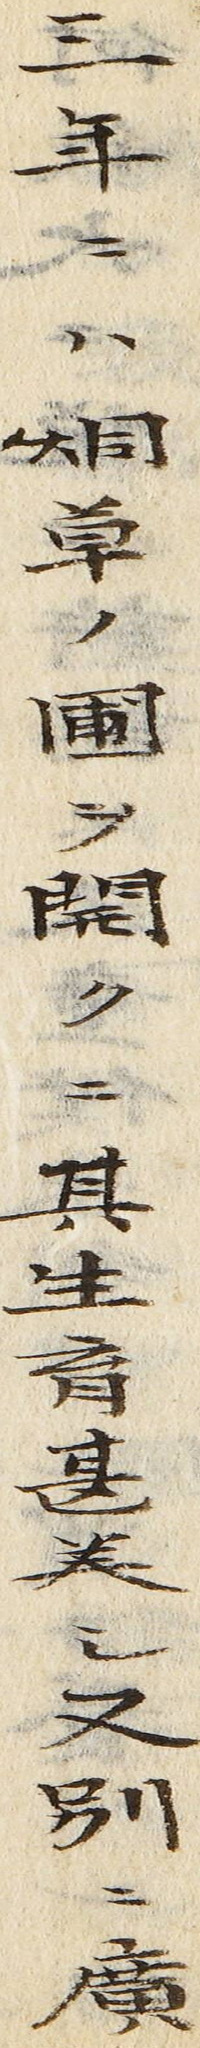三年ニハ烟草ノ圃を開クニ其生育甚美シ又別ニ広
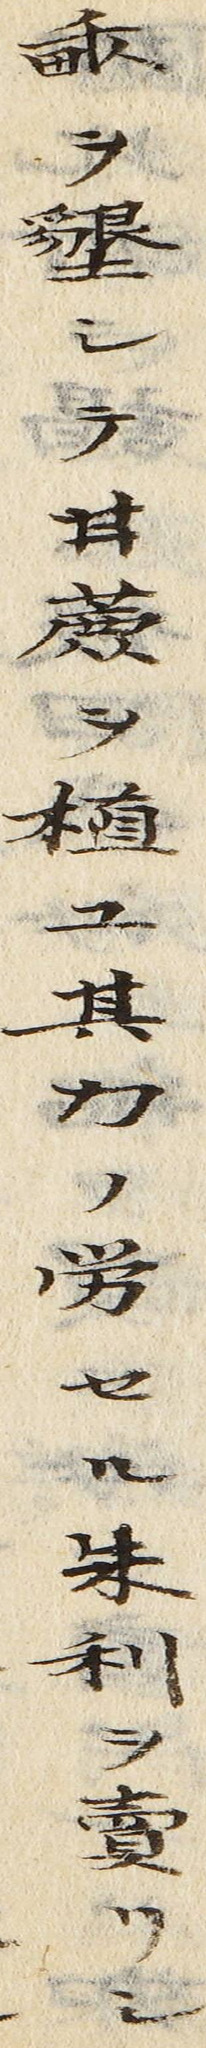畝ヲ墾シテ其蔗ヲ植ユ其力ノ労セル朱利ヲ売リシ
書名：漂流紀事
